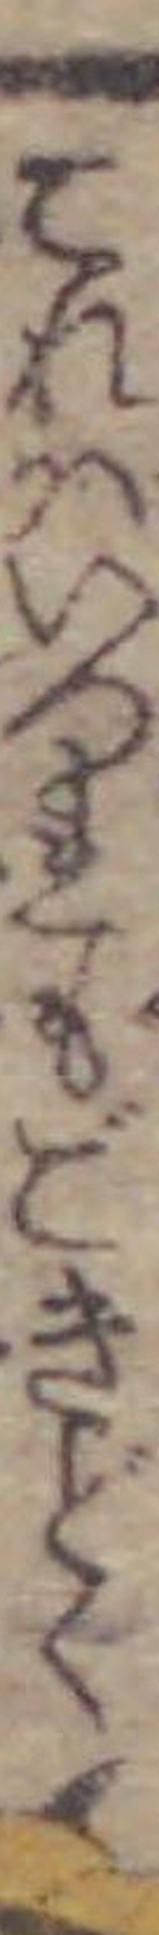これはいつれもごきどく
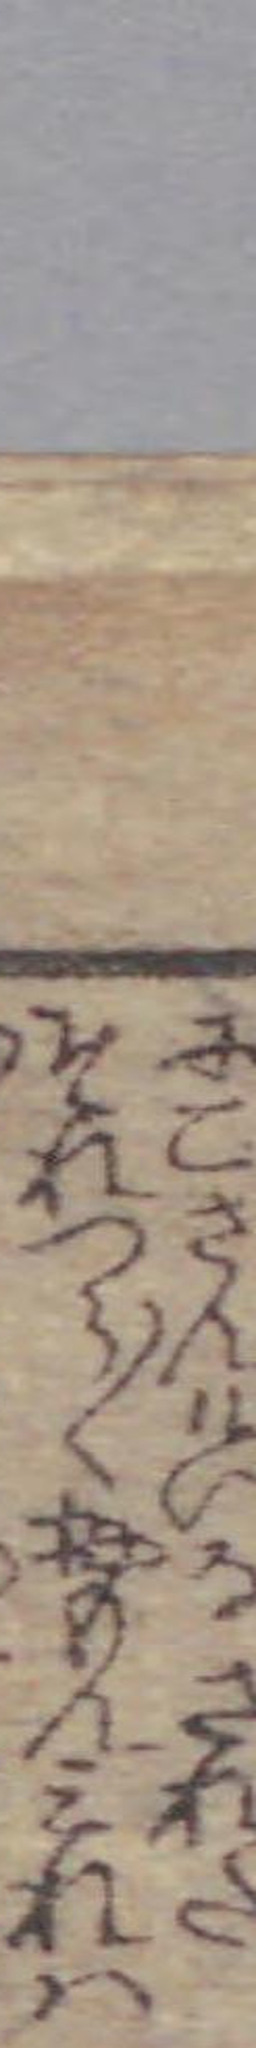それつら〳〵おもんみれは
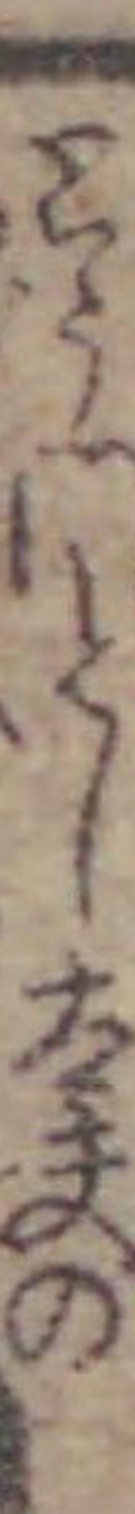とう門とし太夫の
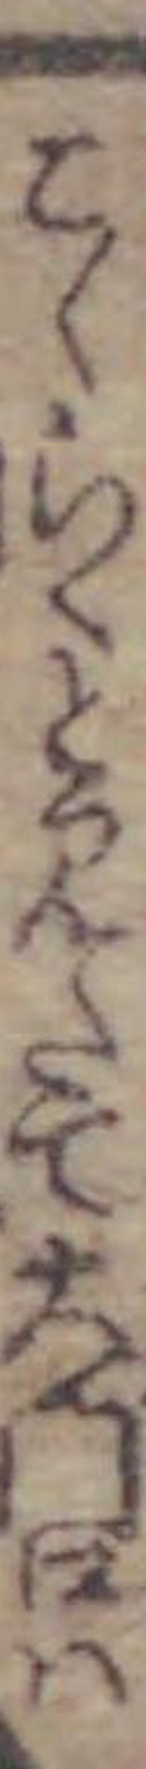こくらくと見たて大門口は
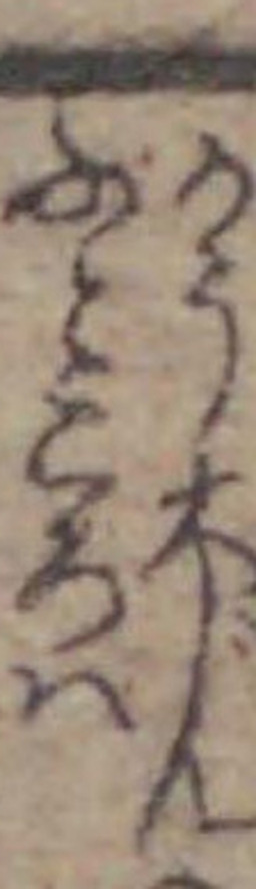ふところは
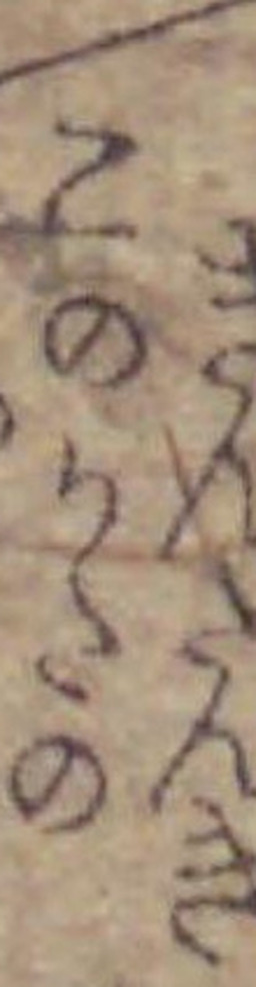このかたの
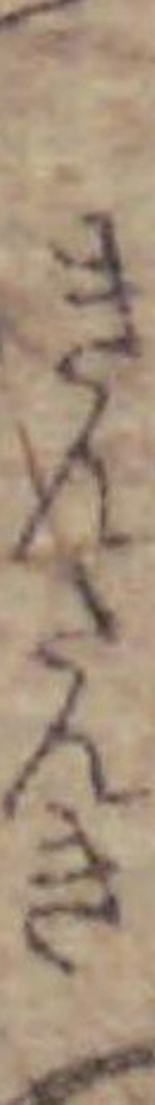きんたんき
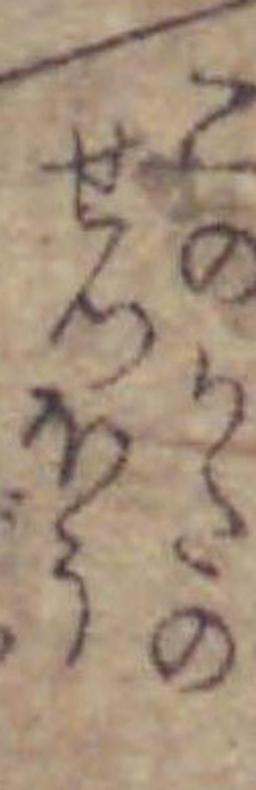せつほう
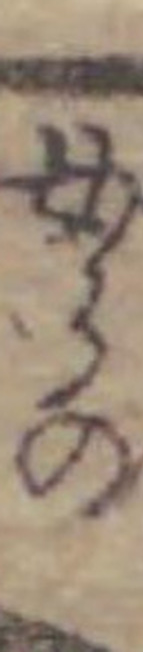女郎の
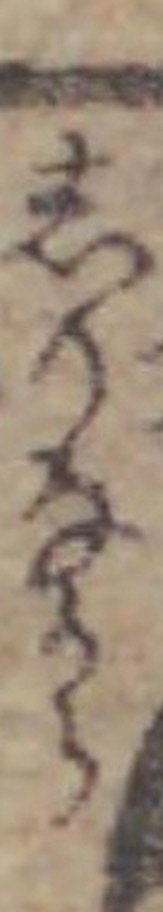しりなから
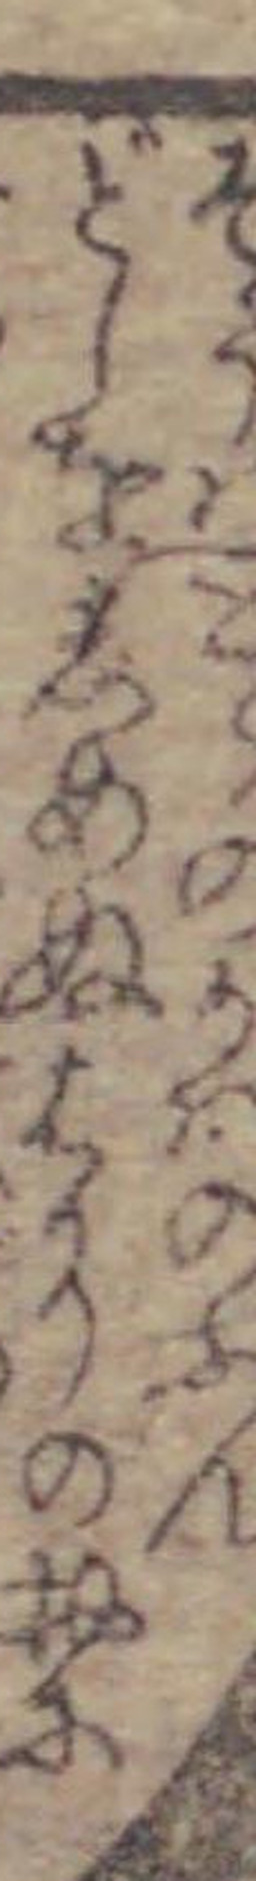どしをしめぬはかりのおに
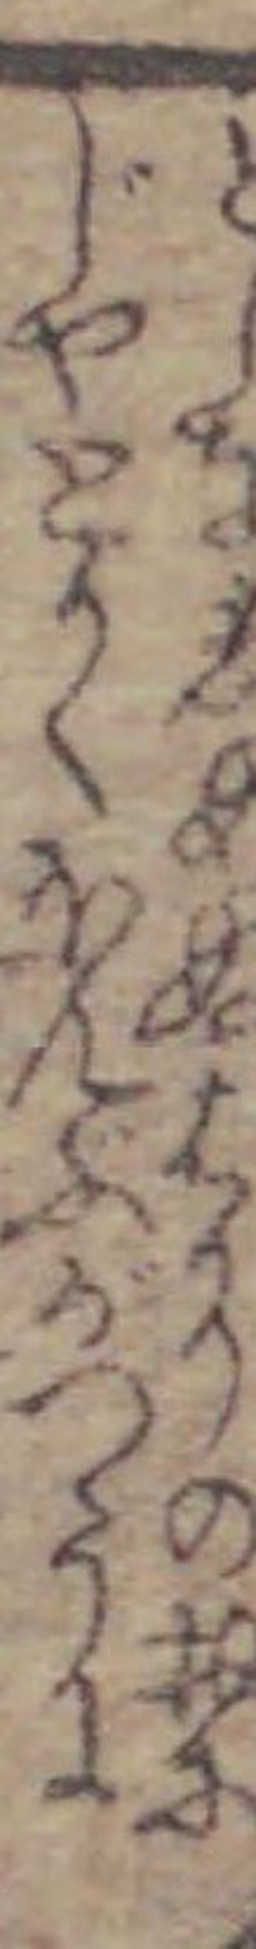じやとかくほんぶがつうに
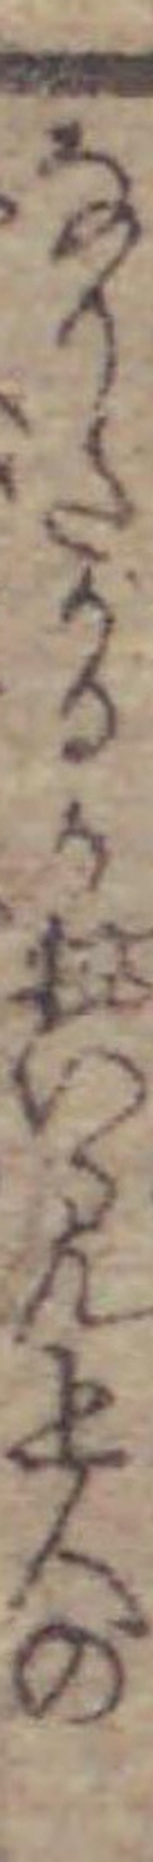なりたかるかおいらん上人の
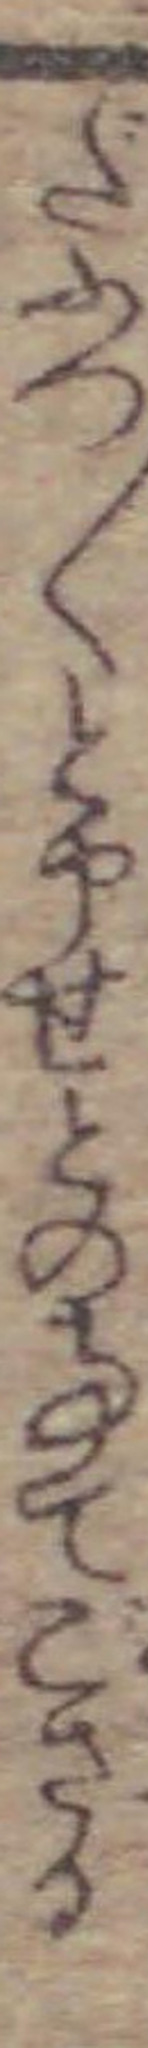だふつ〳〵と申せとの事てごさる
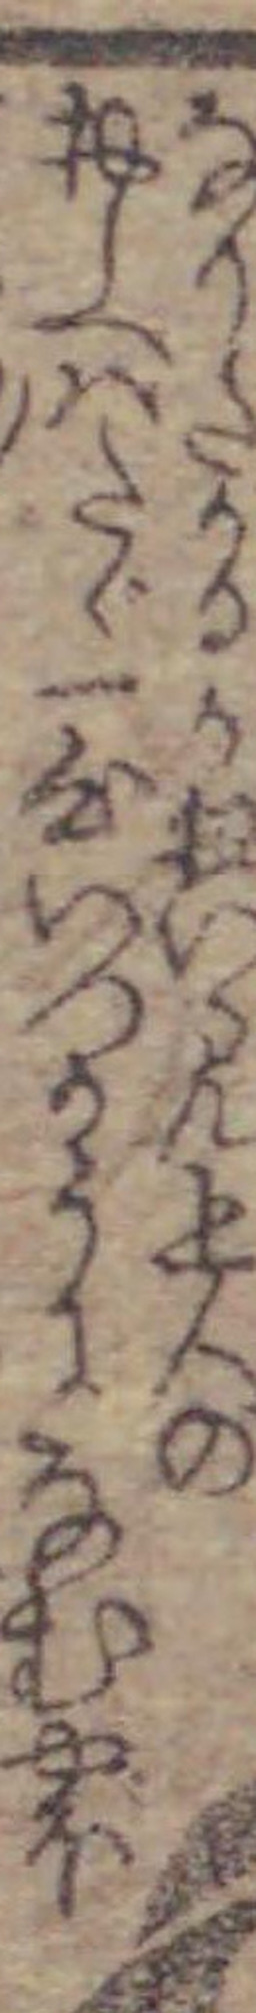おしへはたゞ一心いつかうになむやぼ
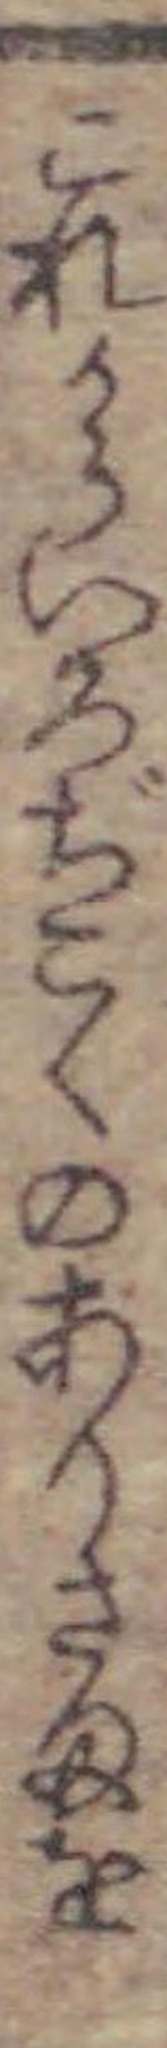これからいろぢこくのありさまを
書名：九替十年色地獄 : 3巻
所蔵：国立国会図書館 National Diet Library, JAPAN
